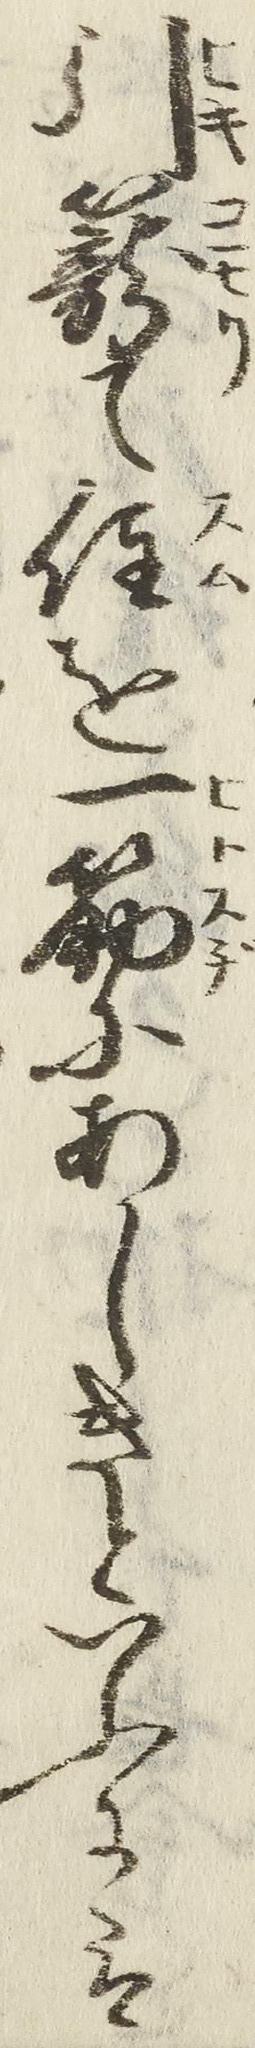引籠て住を一筋にあしきといふには
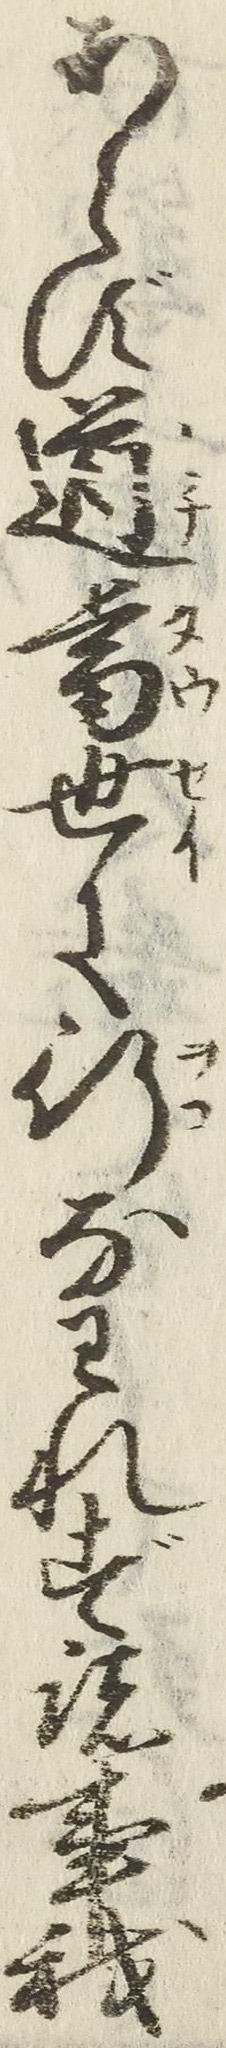あらず道当世に行なわれず諸事我
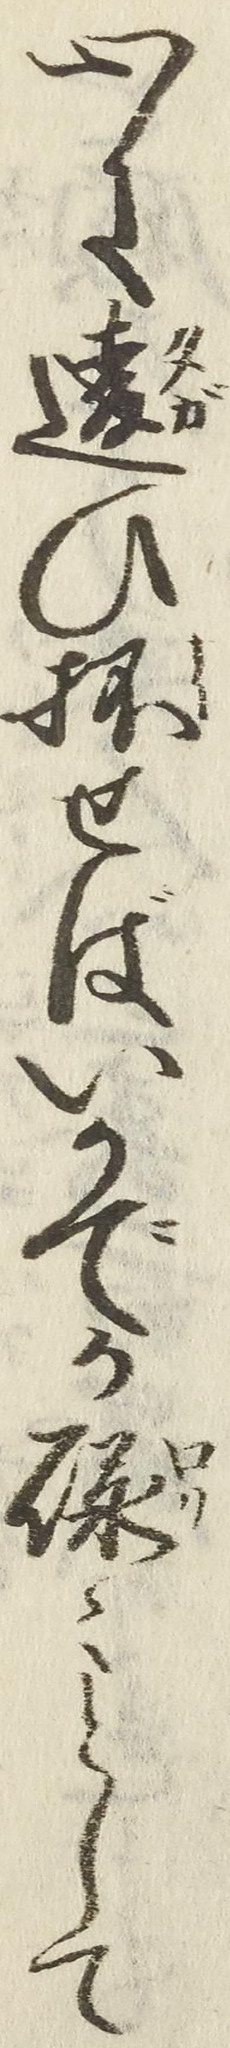心に違ひ抔せばいかでか碌々として
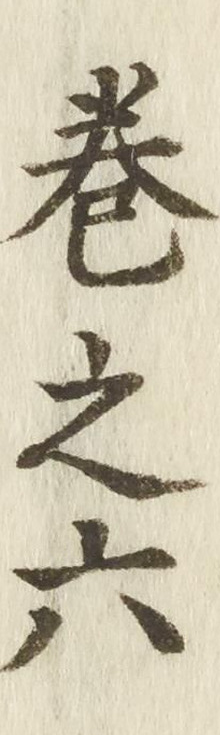巻之六
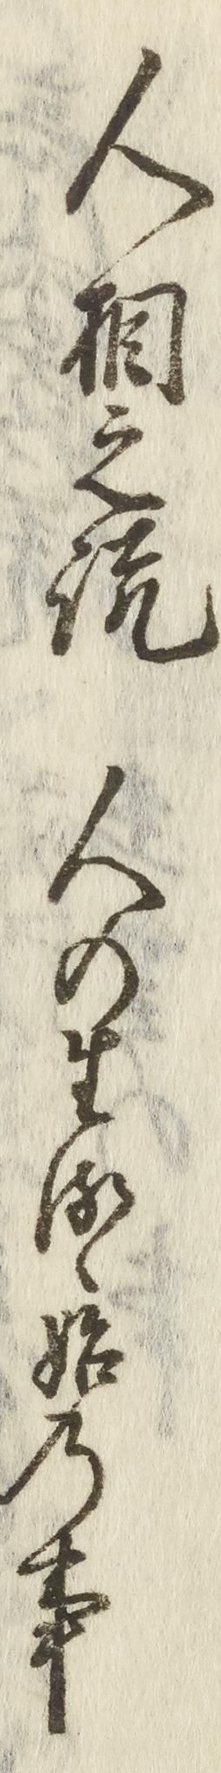人相之説人の生るゝ始の事
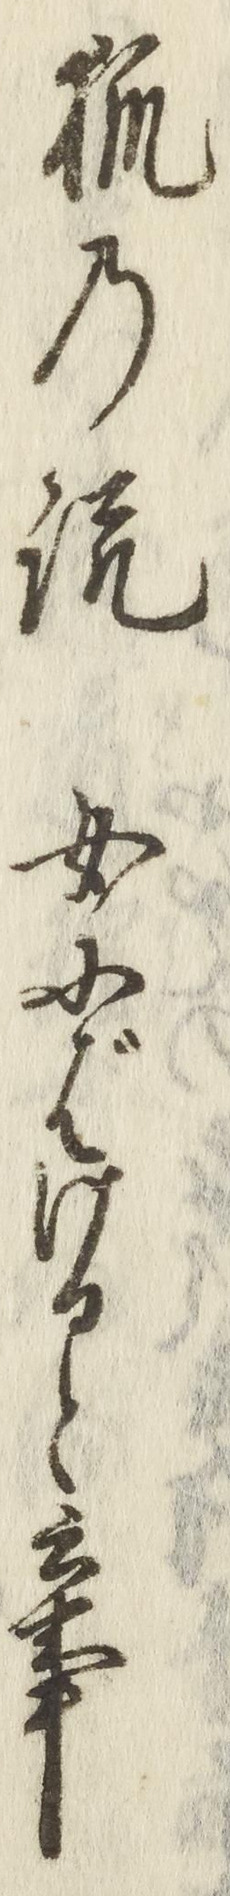狐の説女にばけると云事
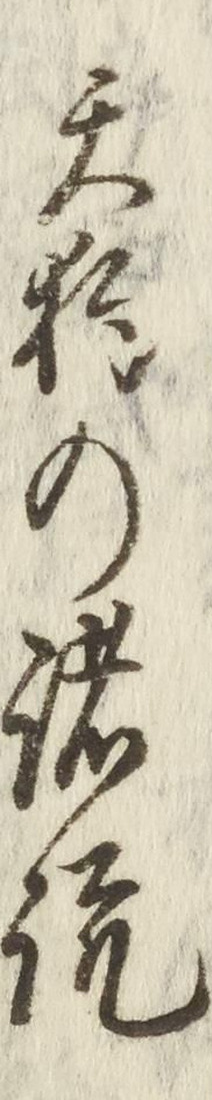天狗の諸説
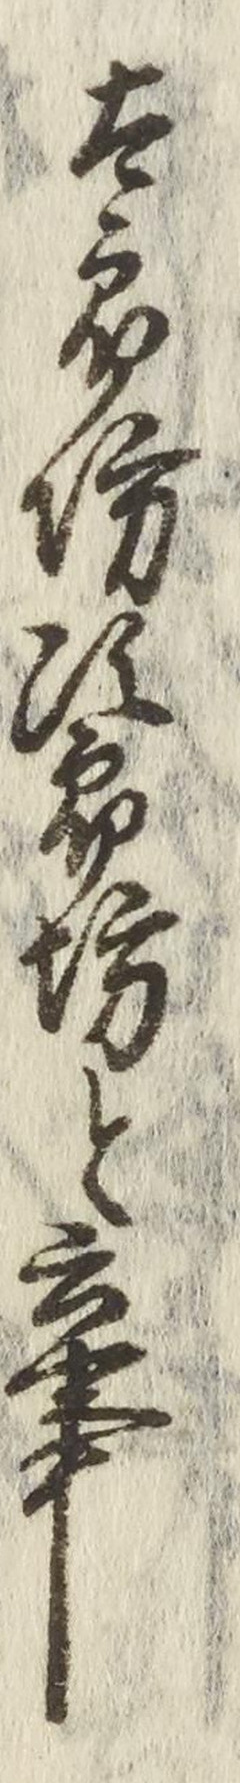太郎坊次郎坊と云事
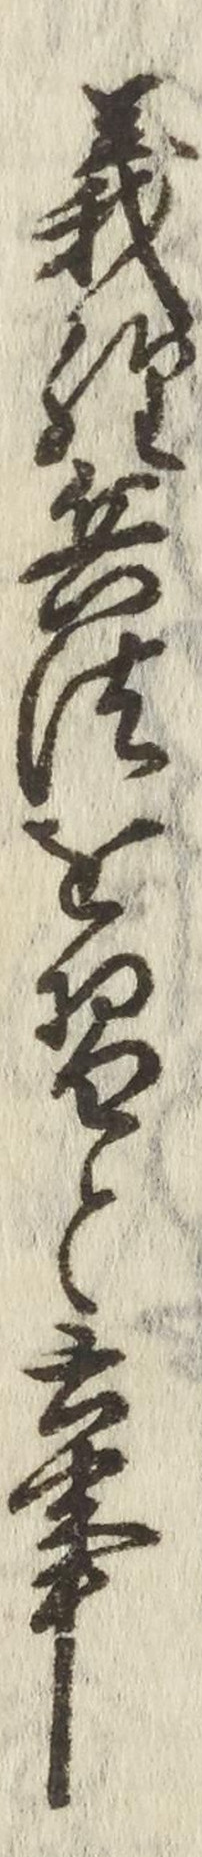義経兵法を習と云事

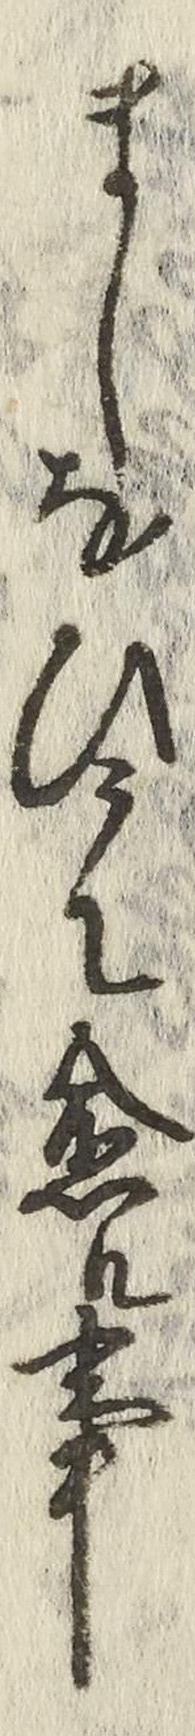ましなひにて愈ル事
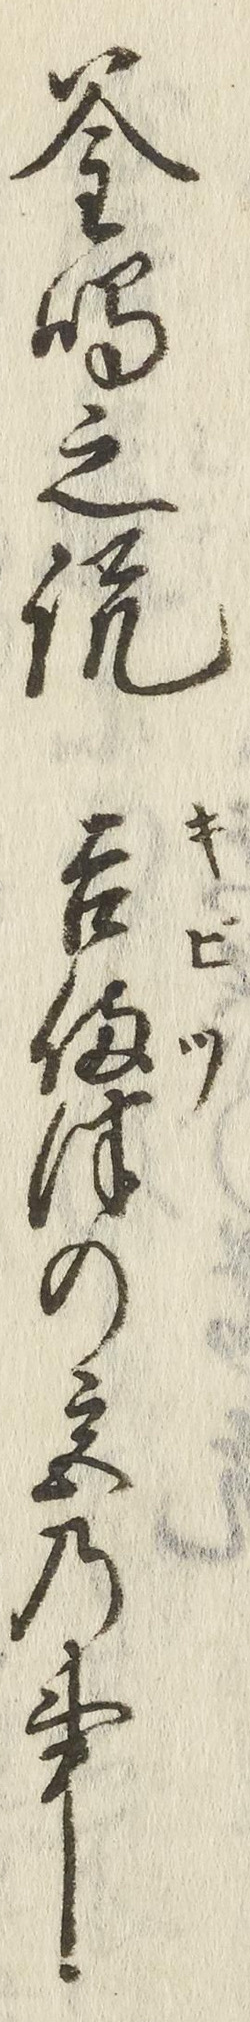釜鳴の説吉備津の宮の事
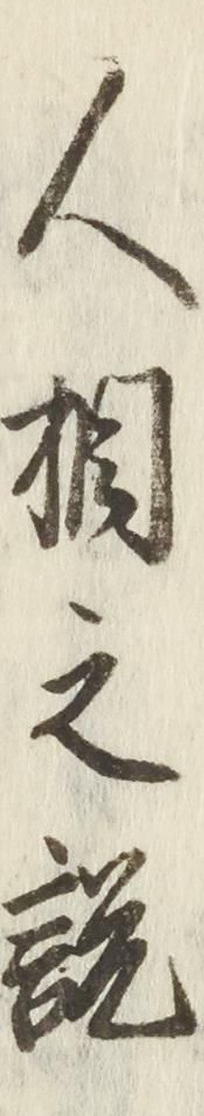人相の説
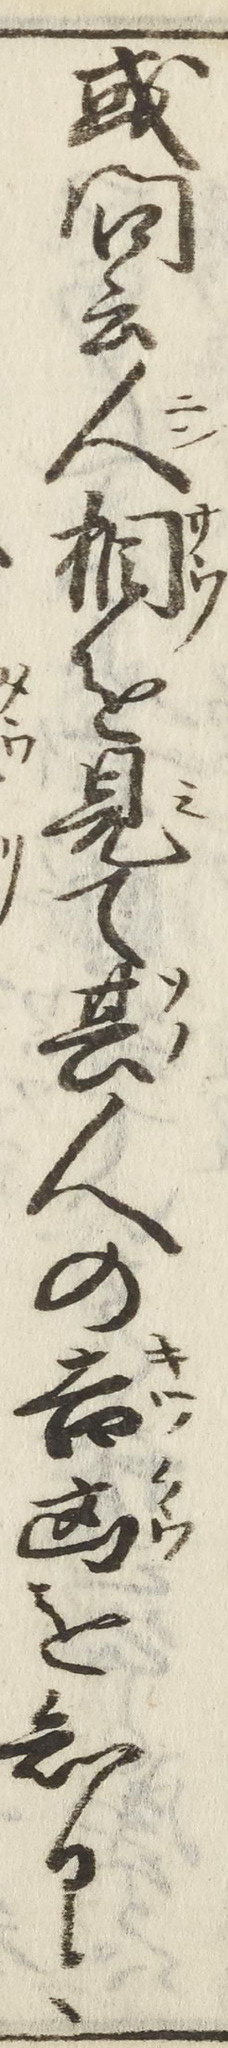或問云人相を見て其人の吉凶を知ると
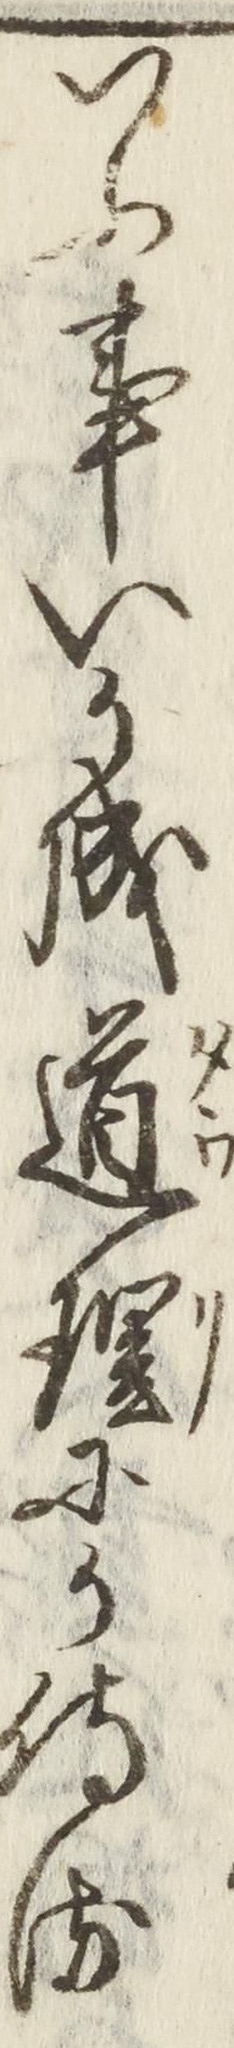いふ事いか成道理にか侍る
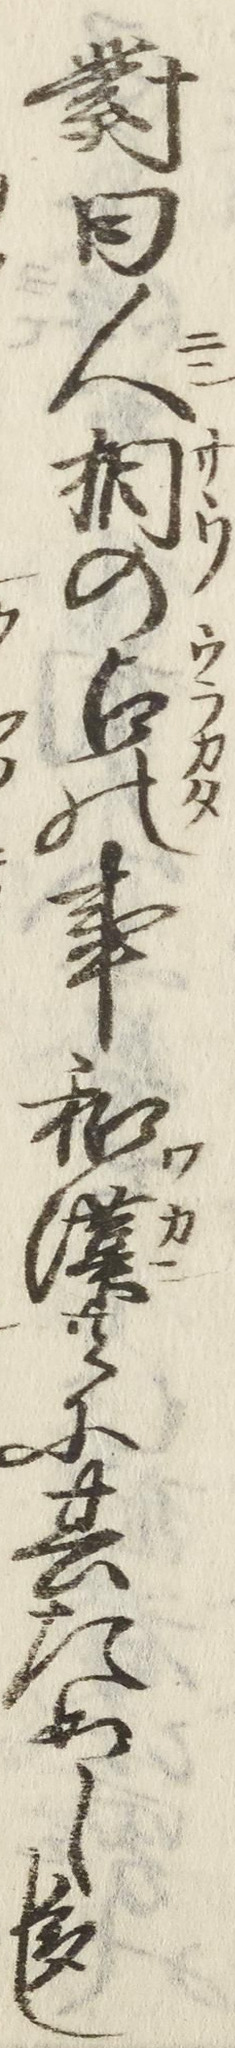対曰人相の占の事和漢共に其ためし多し
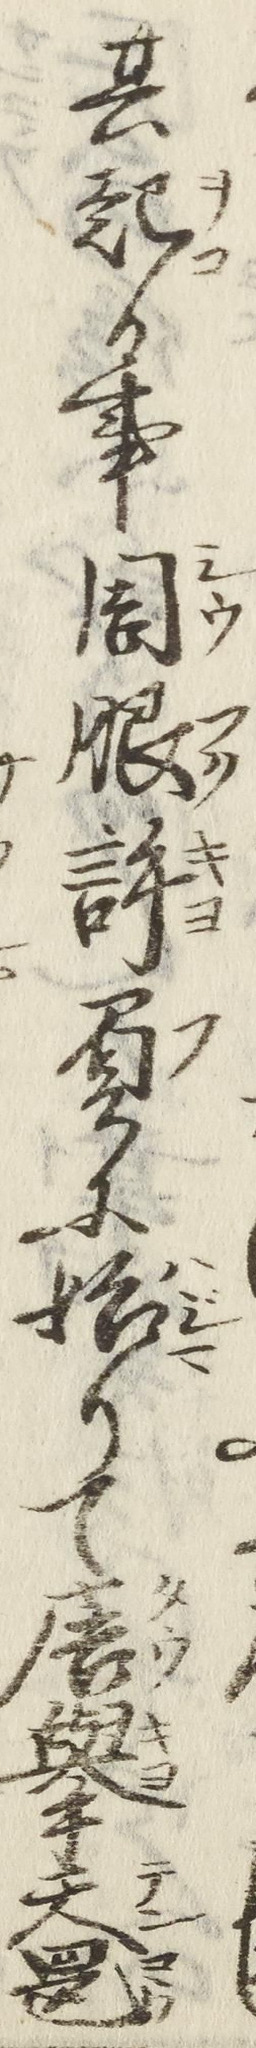其起る事周服許負に始りて唐挙天岡
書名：天地或問珍　地
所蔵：東京大学地震研究所図書室 Earthquake Research Institute Library, The University of Tokyo, JAPAN
